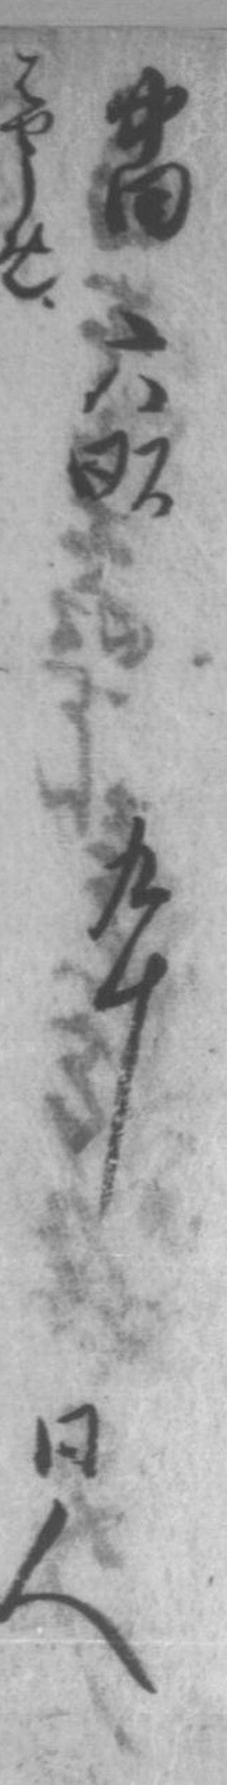中田六畝九斗同人

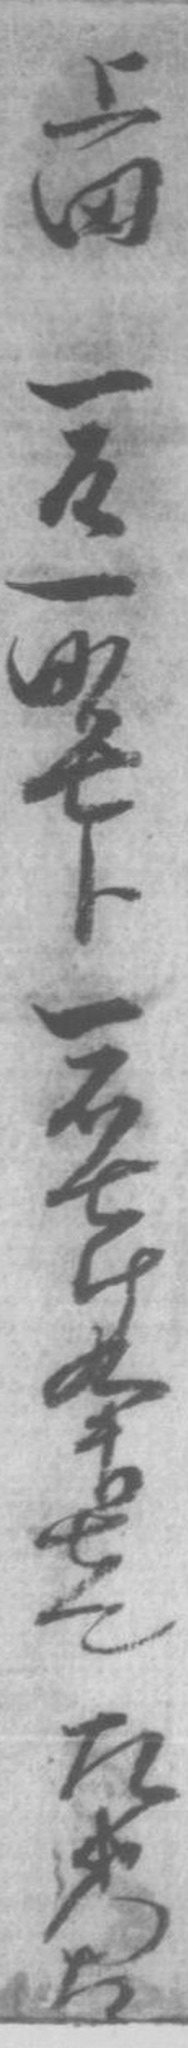上田一反一畝七分一石七斗九升七合左衛門太郎
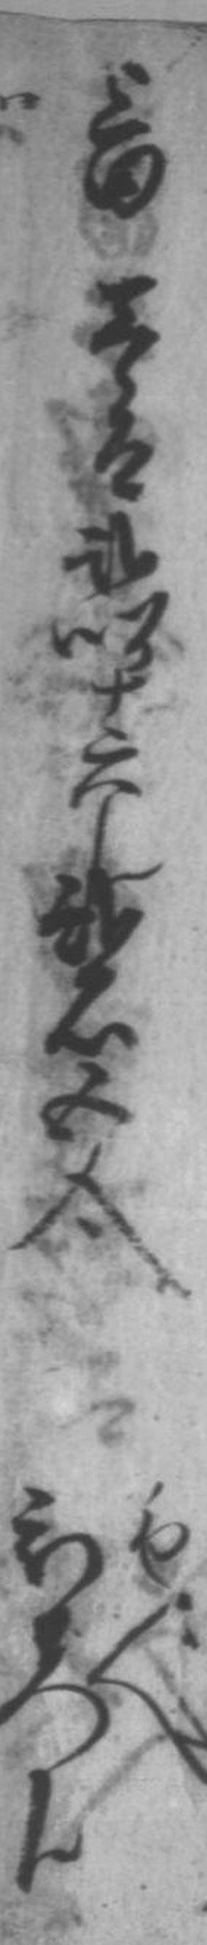上田壱反弐畝十六分弐石五合新右衛門分
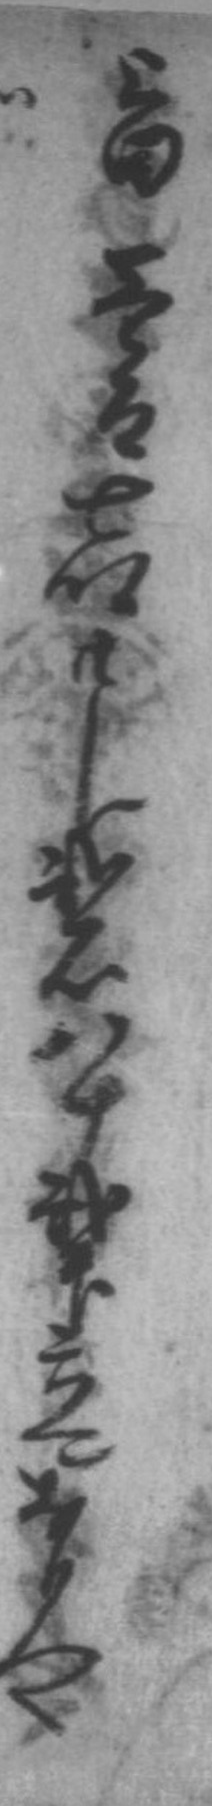上田壱反七畝廿分弐石八斗弐升六合おりや

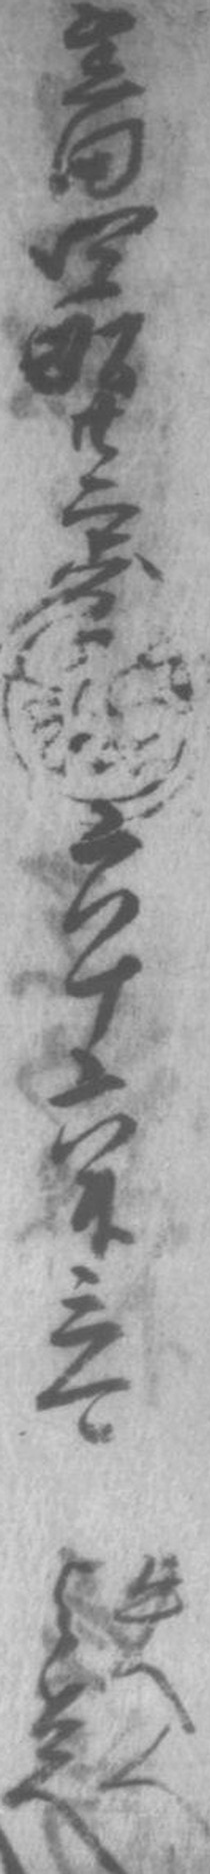荒田四畝廿二歩㊞六斗六升三合与兵衛
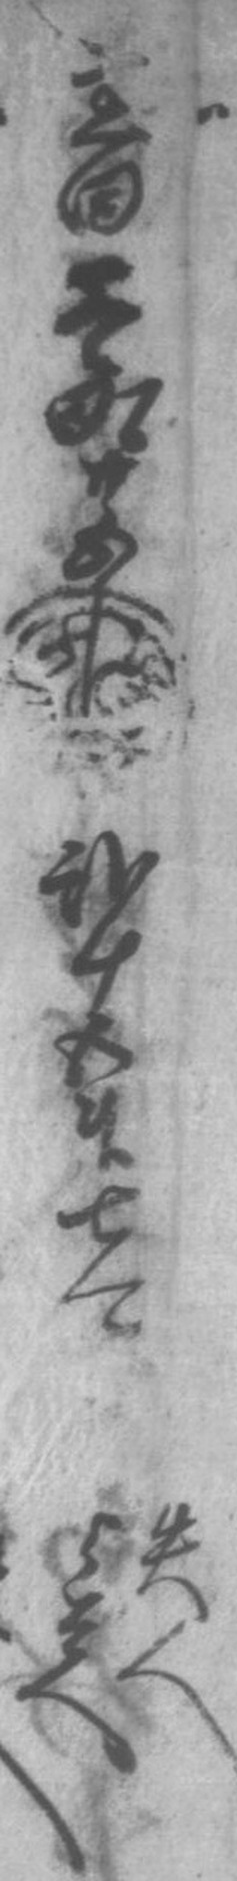荒田壱畝廿五分㊞弐斗五升七合与兵衛
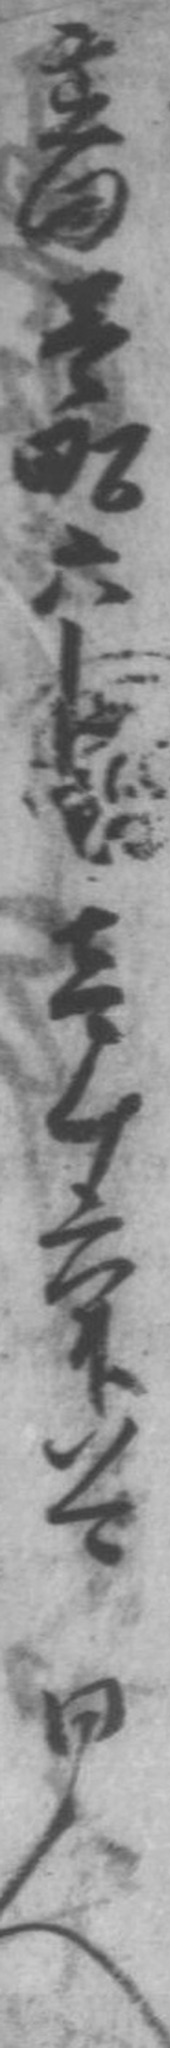荒田壱畝六分㊞壱斗六升八合同人
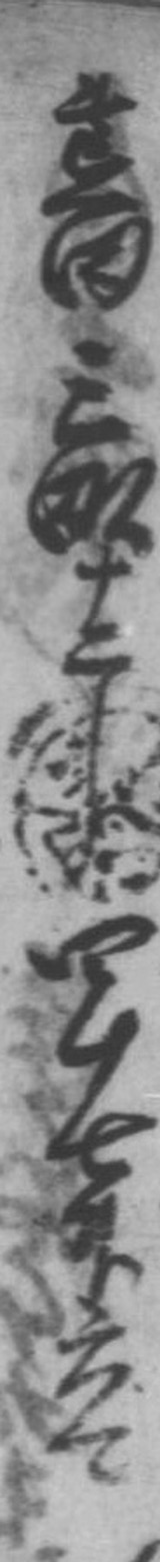荒田三畝十二分㊞四斗七升六合同人
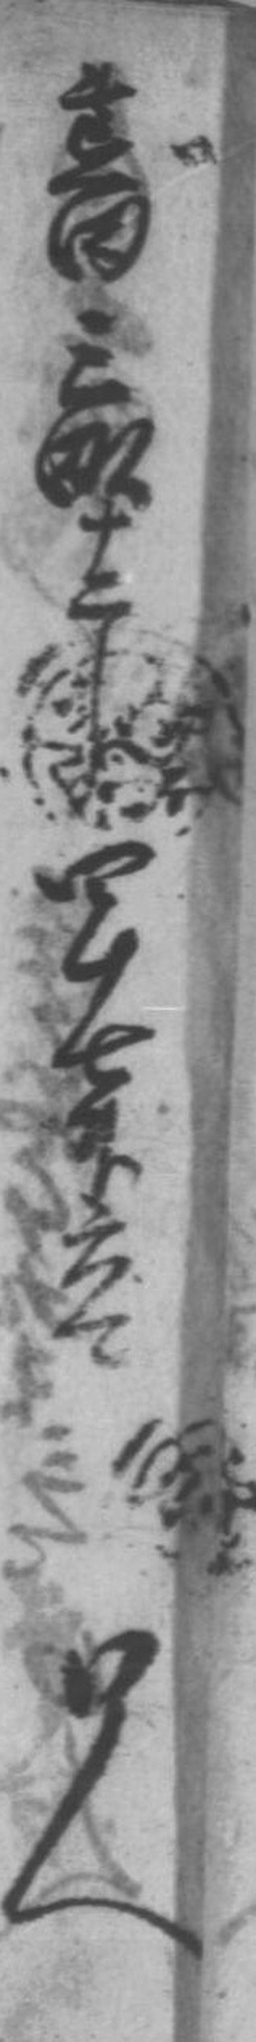荒田三畝十二分㊞四斗七升六合同人
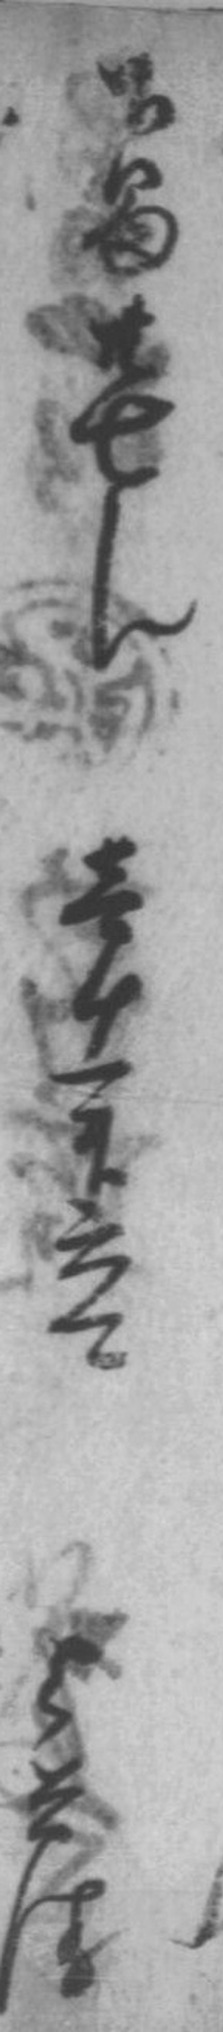下畑廿七分㊞壱斗一升六合与兵衛
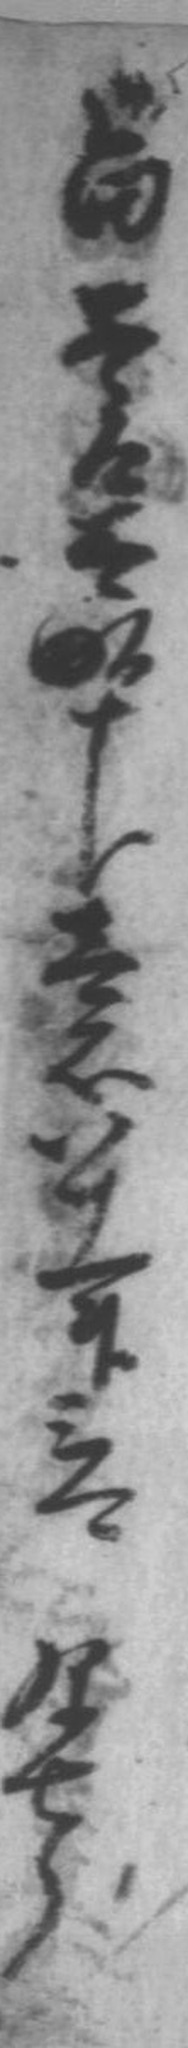上田壱反壱畝十分壱石八斗一升三合弥七郎
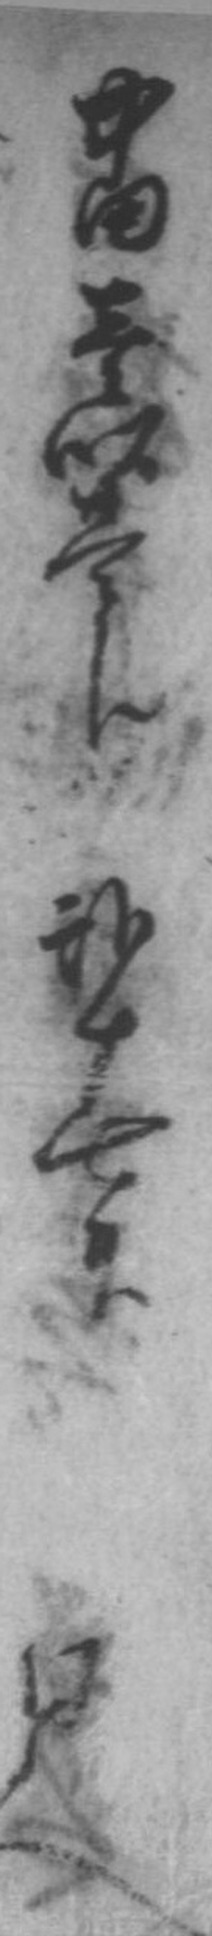中田壱畝廿四分弐斗三升同人
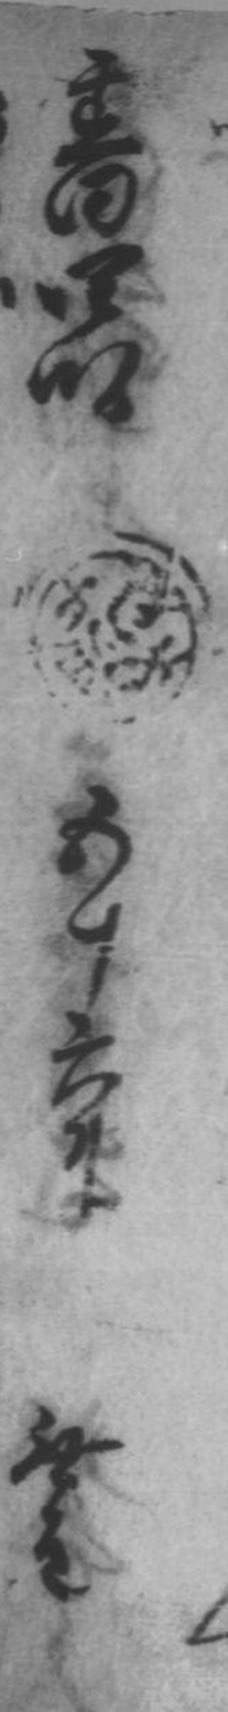荒田四畝㊞五斗六升無主

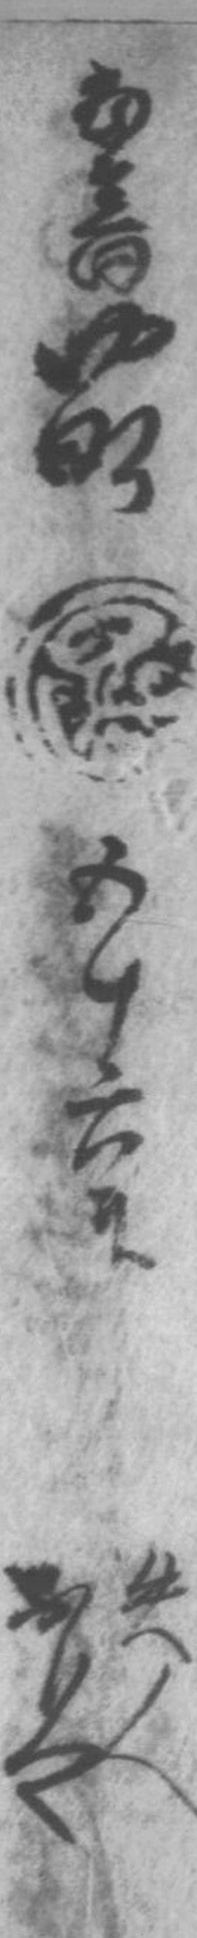当荒田四畝㊞五斗六升おりや
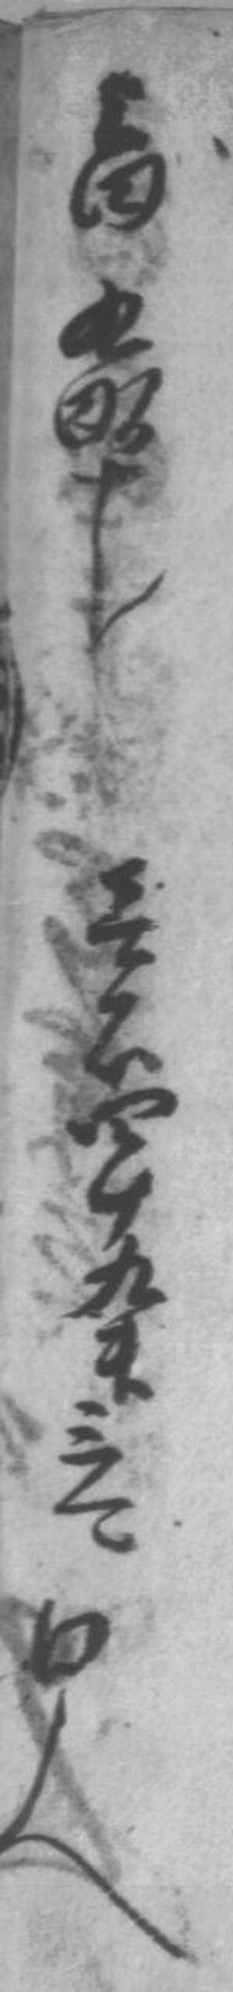上田九畝十分壱石四斗九升三合同人
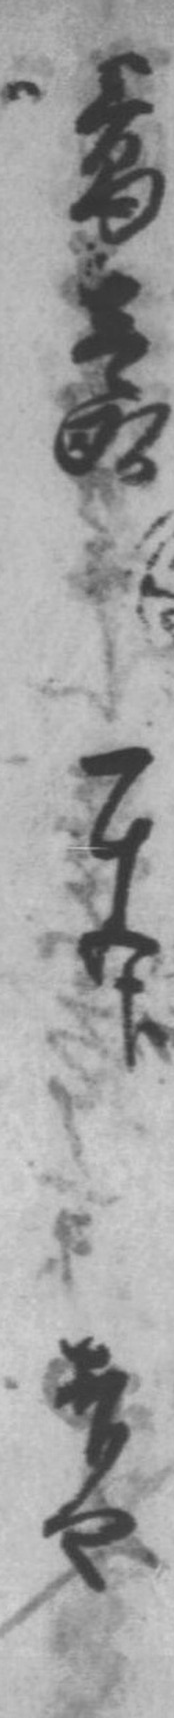上畠壱畝一斗五升おりや
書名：越州大野郡ノ内不動堂村御検地帳
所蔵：福井県文書館 Fukui Prefectural Archives
